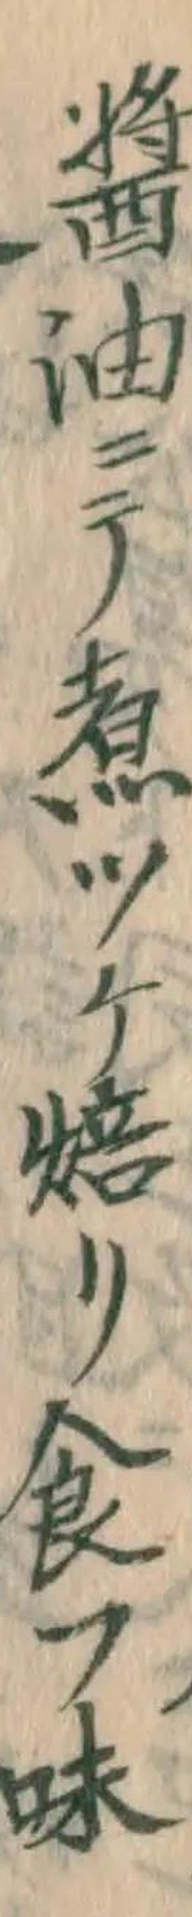醤油ニテ煮ツケ焙リ食フ味
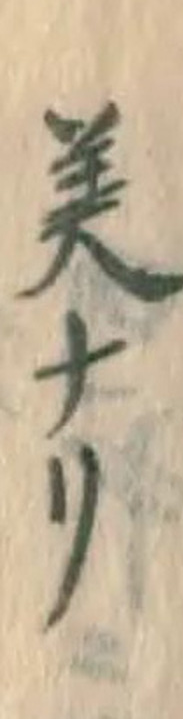美ナリ
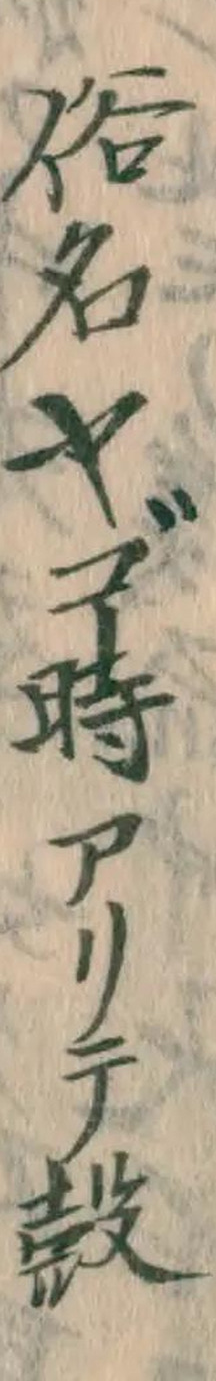俗名ヤゴ時アリテ殻
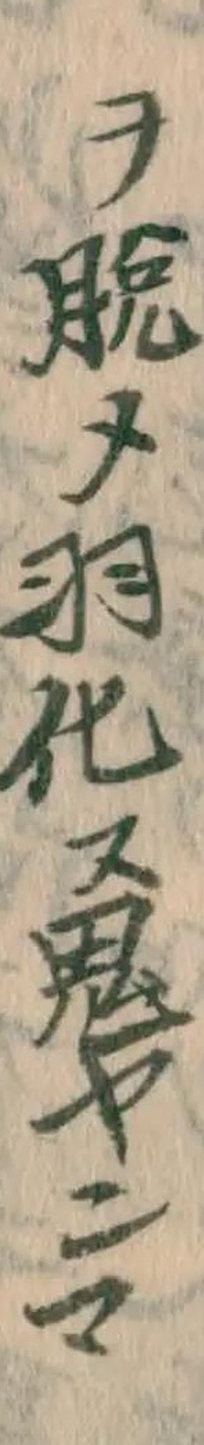ヲ脱シテ羽化ス鬼ヤンマ
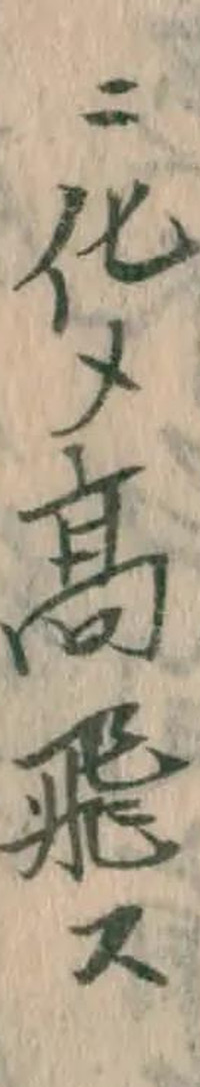ニ化シテ高飛ス
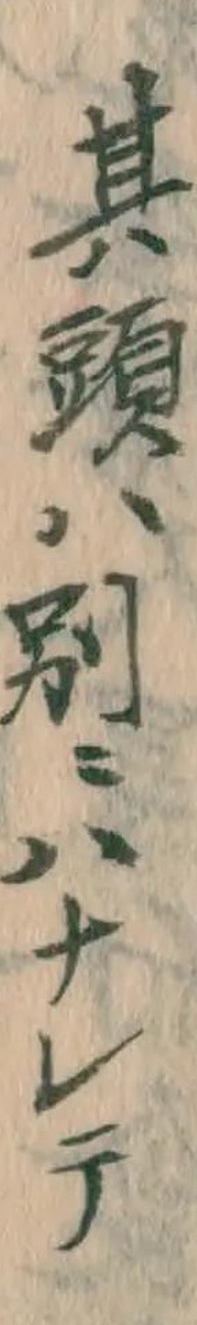其頭ハ別ニハナレテ
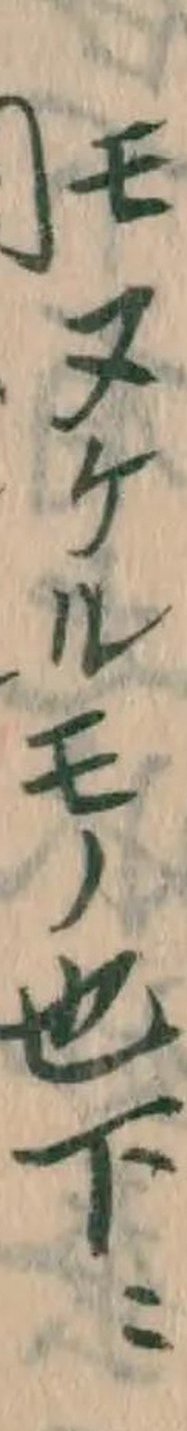モヌケルモノ也下ニ
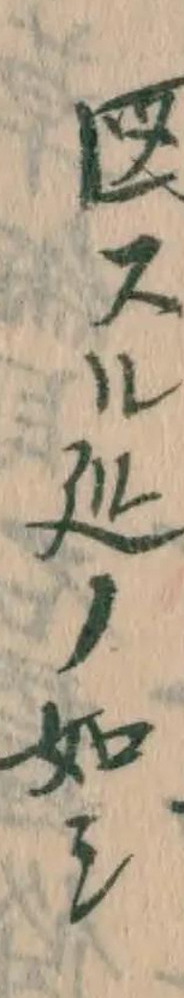図スル処ノ如シ
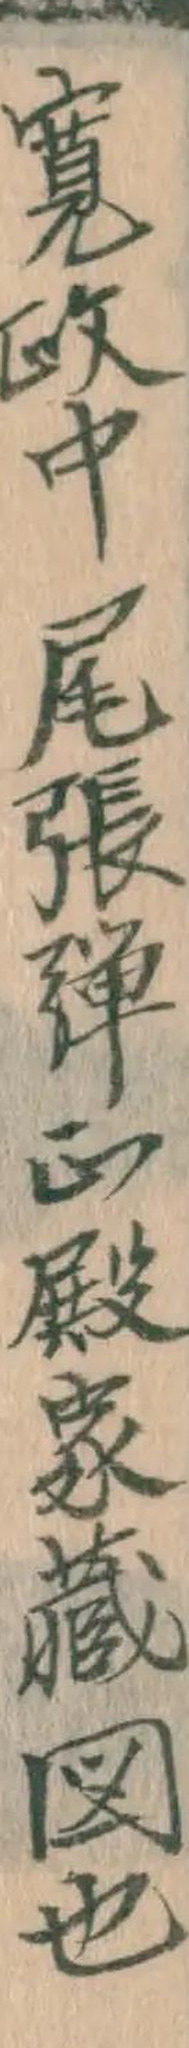寛政中尾張弾正殿家藏図也
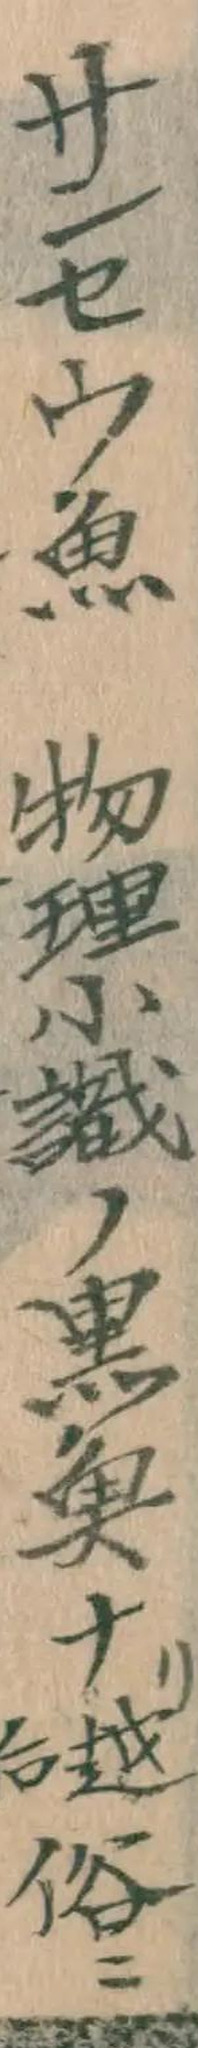サンセウ魚物理小識ノ黒魚ナリ越后俗ニ
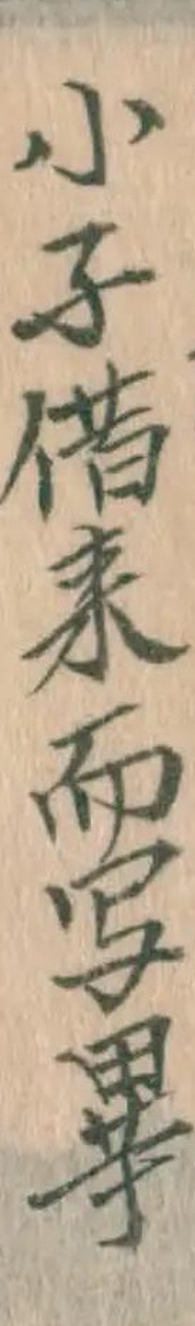小子借来而写畢
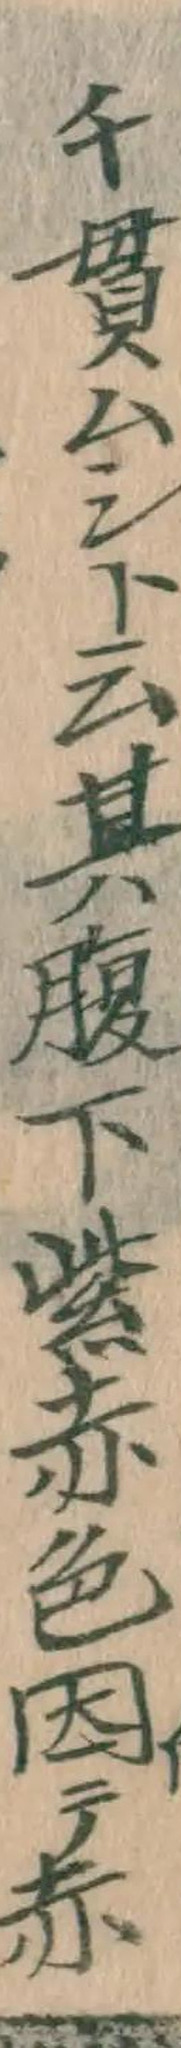千貫ムシト云其腹下紫赤色因テ赤
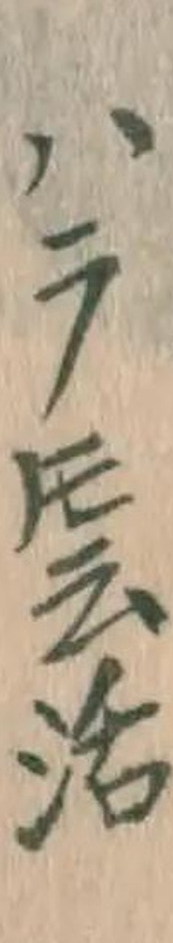ハラトモ云活
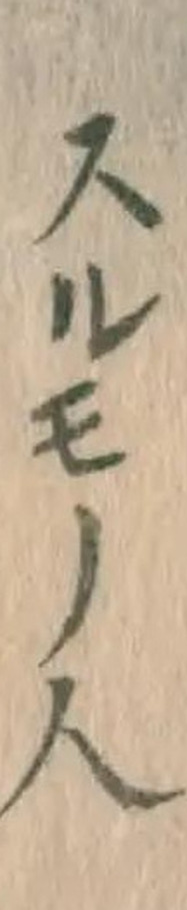スルモノ人
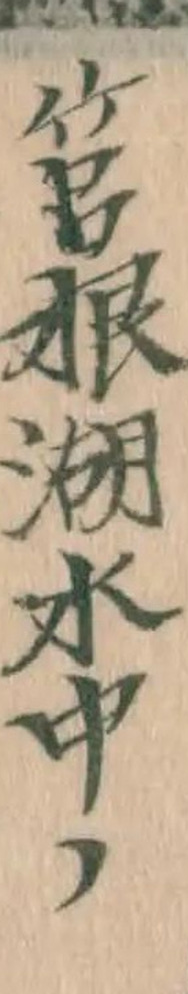筥根湖水中ノ
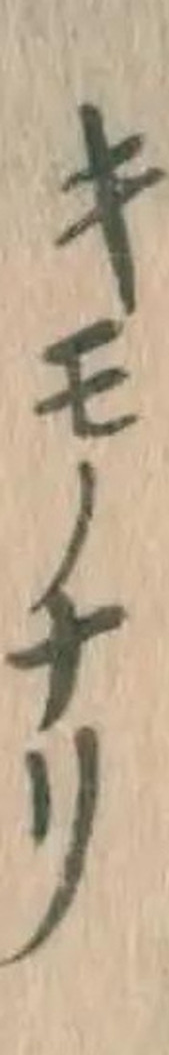キモノナリ
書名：千蟲譜 3巻. [1]
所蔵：国立国会図書館 National Diet Library, JAPAN
